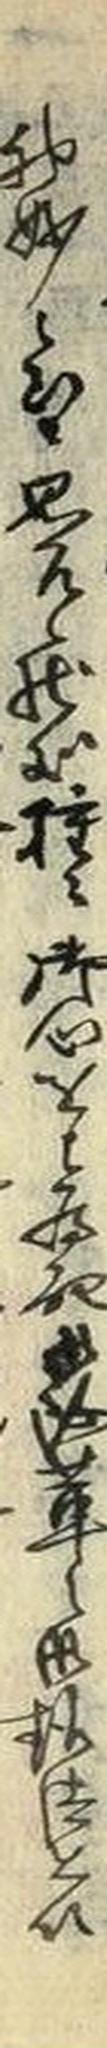神妙之至ニ思召候然処種々御心を被為配御改革之御趣法を以
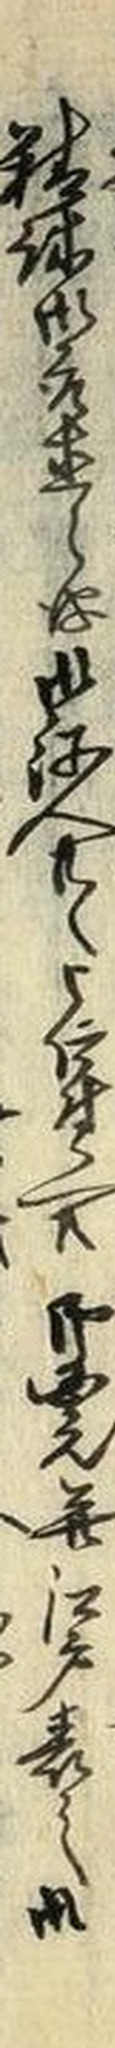精誠御取置之儀御役人共へ被仰付候へ共御国元幷江戸表之御
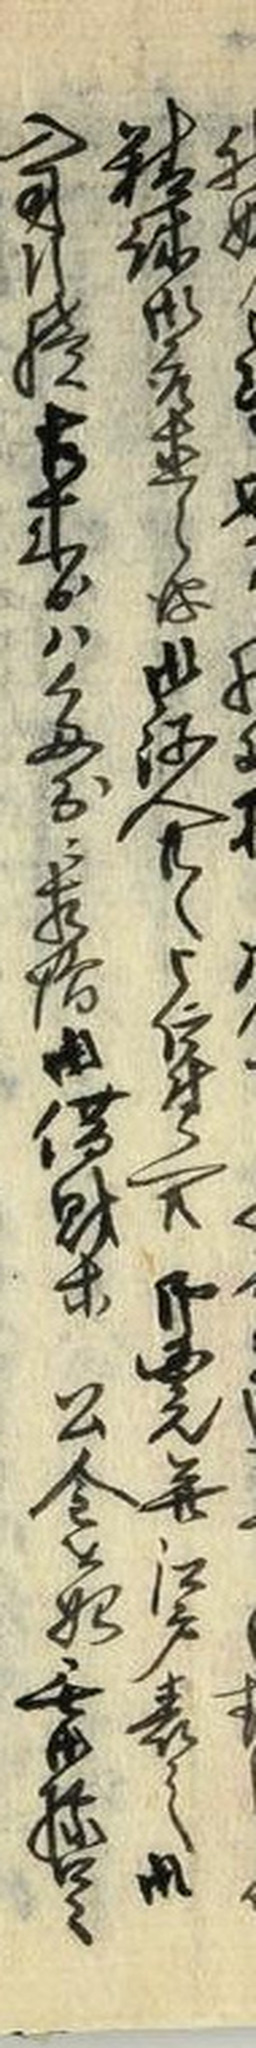入用引続古来ゟハ多分ニ相恪御借財等公金を始無御拠口々
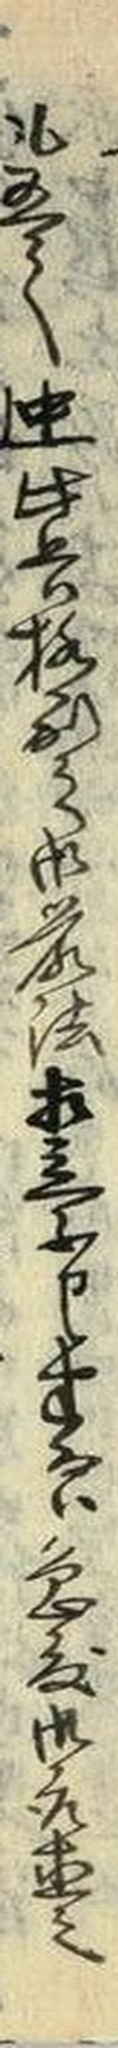も有之迚此上ハ格別之御厳法相立不申候半而ハ急度御取置之
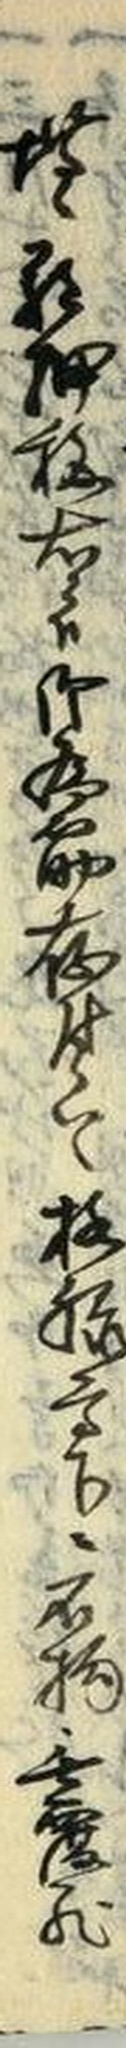場へ難押移右ニ付御為筋存付候ハヽ格統高下ニ不拘無覆非
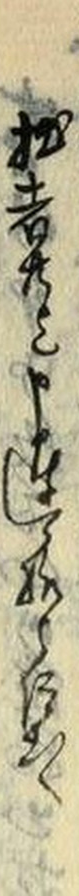拙者共迄申達候様被仰出候
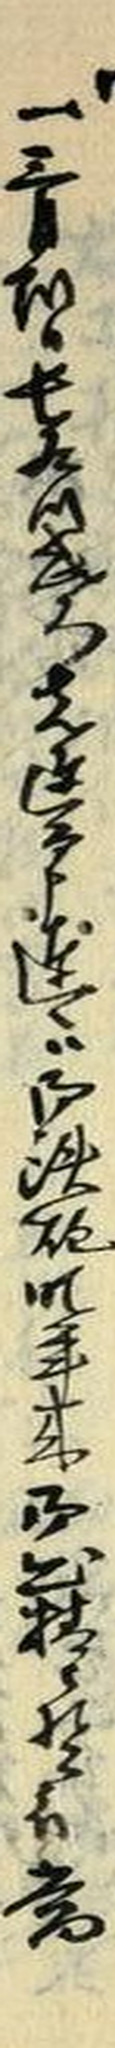同一三月朔日長谷川武右衛門先達而申達候ハ御鉄炮之間昨年来御出精被遊候ニ付当
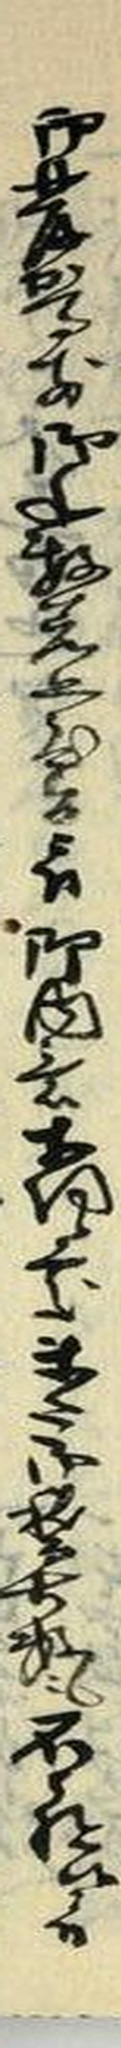御発駕前御手数差上度旨ニ付御内意相伺候処未た御稽古数も不被遊候ニ付
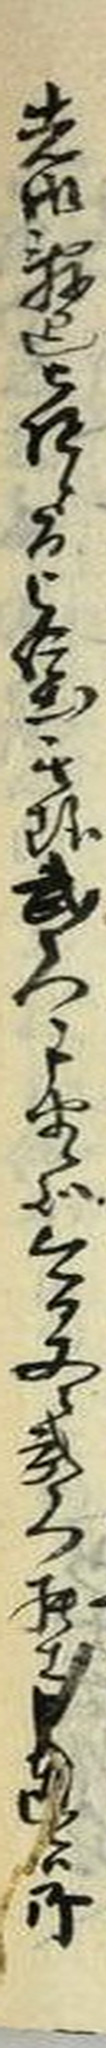先御辞退被遊候旨被仰出其趣武右衛門へ申聞候処今日又々武右衛門罷出申達候ハ御
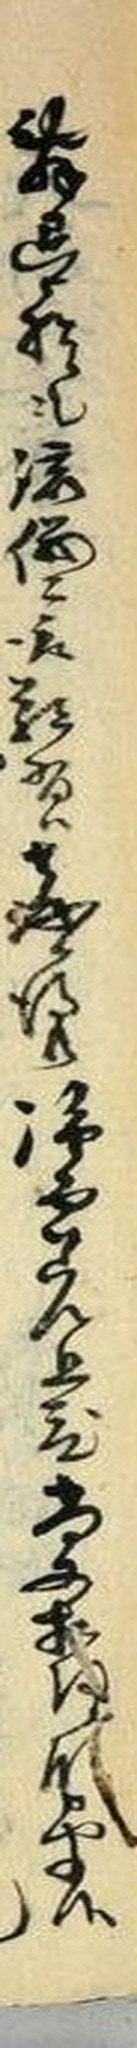辞退被遊候も流儀ニ取難有ハ被存候得共強而差上度尚又相伺候段申聞候
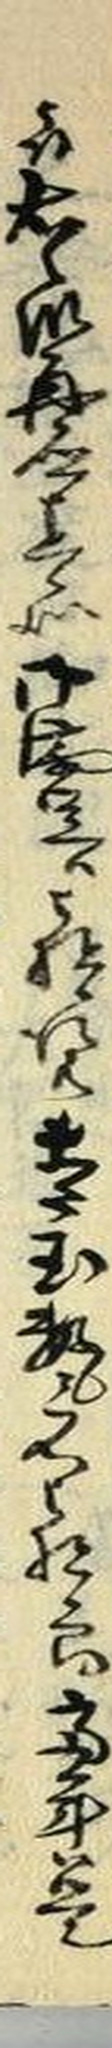ニ付右之段再応申上候処御満足ハ被遊候得共夫々玉数も不被遊候間当年ハ是
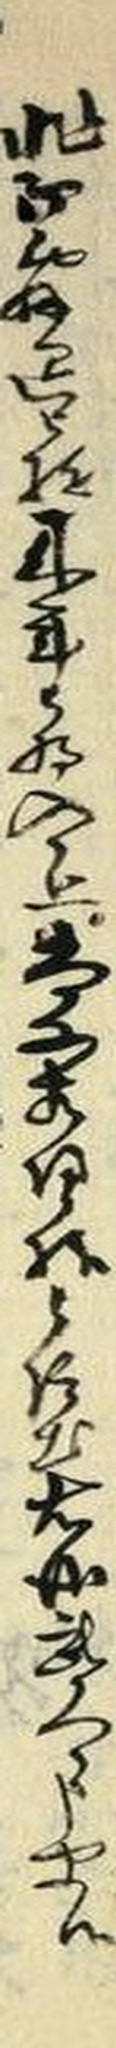非御辞退被遊来年被為入候上尚又相伺候様被仰出右趣武右衛門へ申聞候
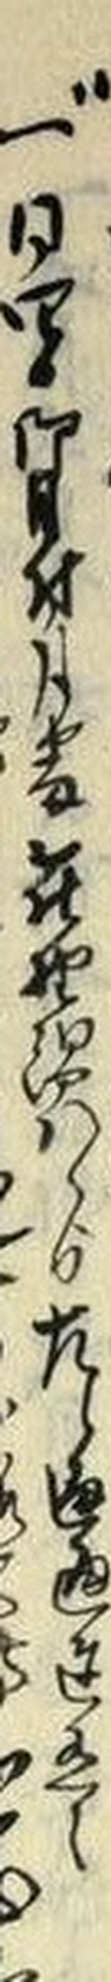同一同四日御目付月番荻野鍋八郎ゟ左之通通達有之
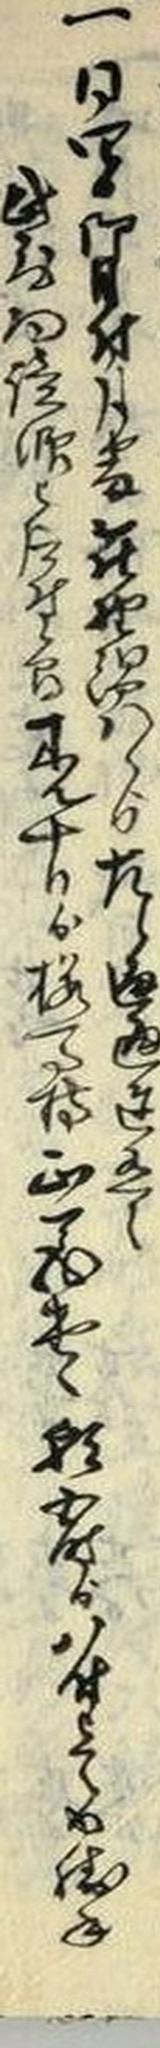此度句読師被仰付候間来ル十日ゟ桜馬場正蔵堂へ朝五時ゟ八時迄之内勝手
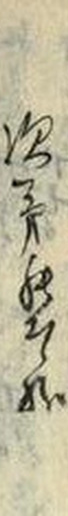次第罷出候様

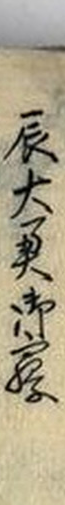辰大奥御寝
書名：少傅日録抄（斉承付側向頭取日記、在国）
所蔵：福井県文書館 Fukui Prefectural Archives
